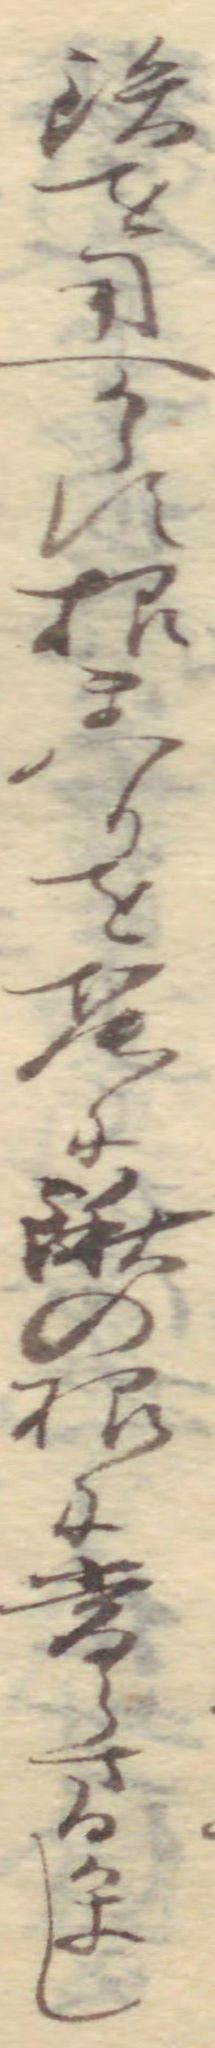鉄を用へからす根まハりを掘に鍬の根に当たらさるかよし
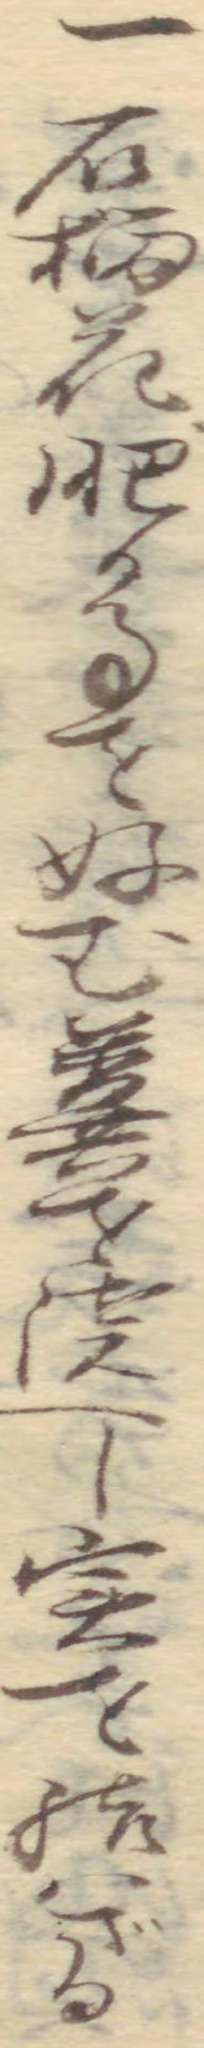一石楠花肥る事を好む糞を澆へし実を結ハざる
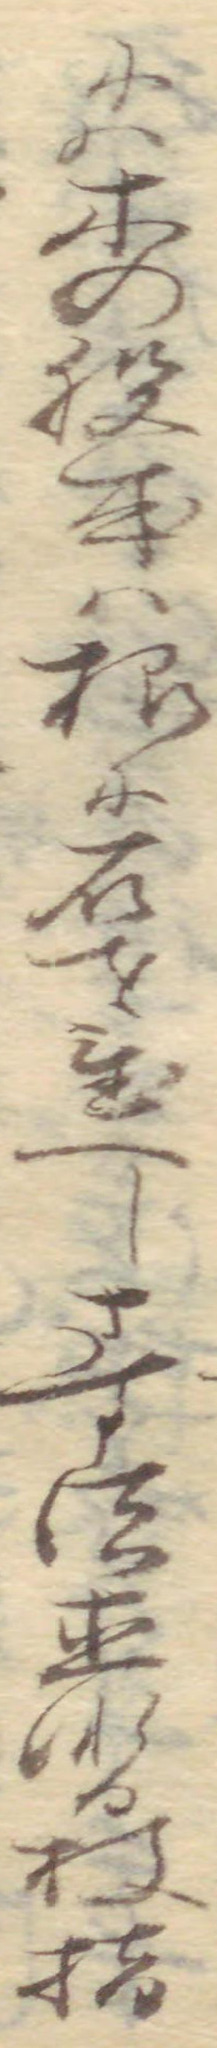にハ木の股或ハ根に石を置へしさす法直なる枝指
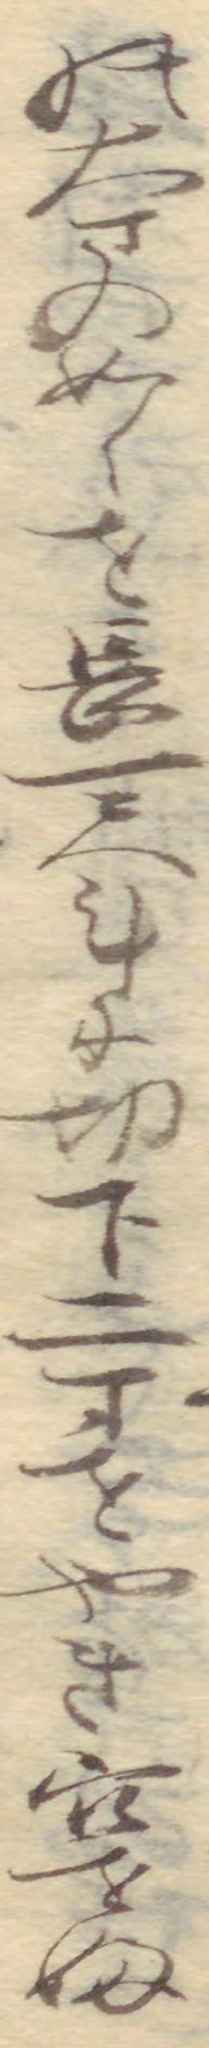の大さの如くを長一尺斗に切下二寸をやき穴をふ
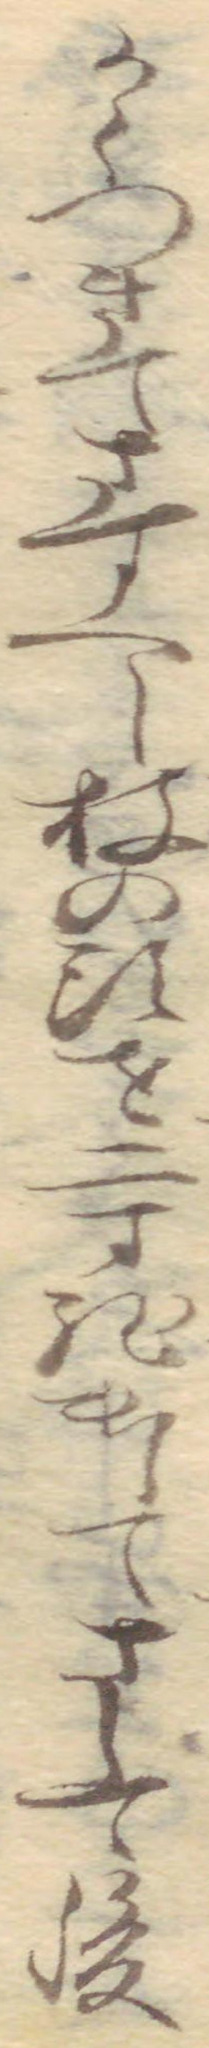かくつきてさすへし枝の頭を二寸程出してさして後
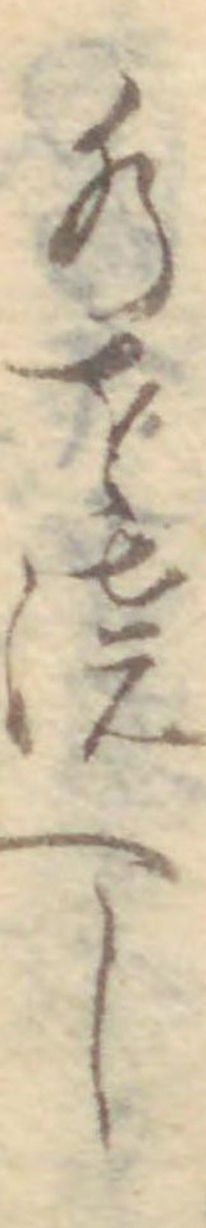水を澆へし
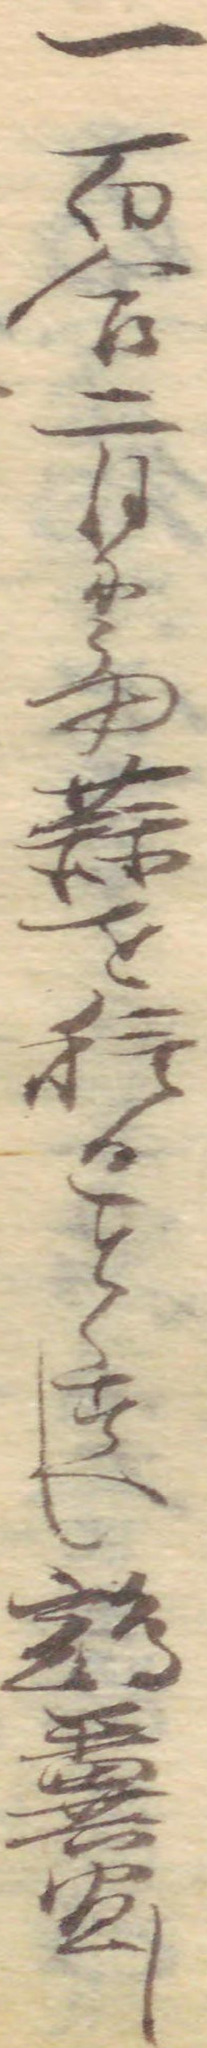一百合二月にうゆ蒜を種ることくすへし鶏糞宜し
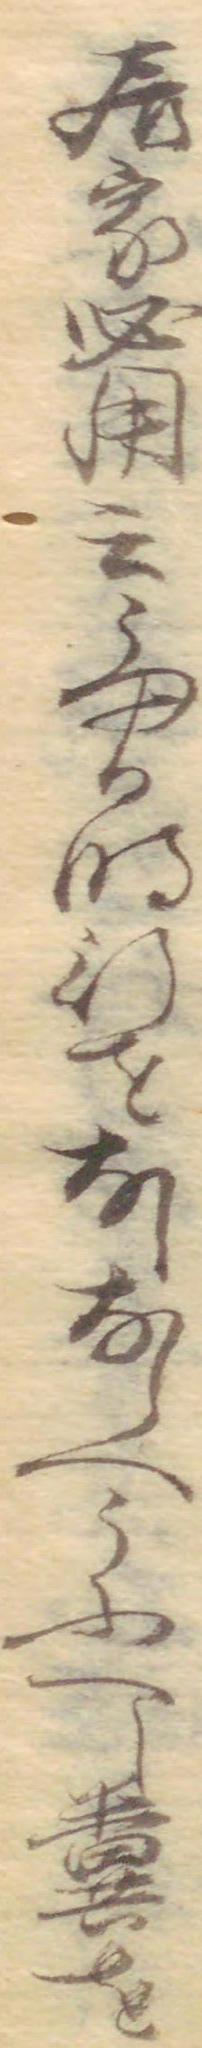居家必用云うゆる時行をなしならへうふへし糞を

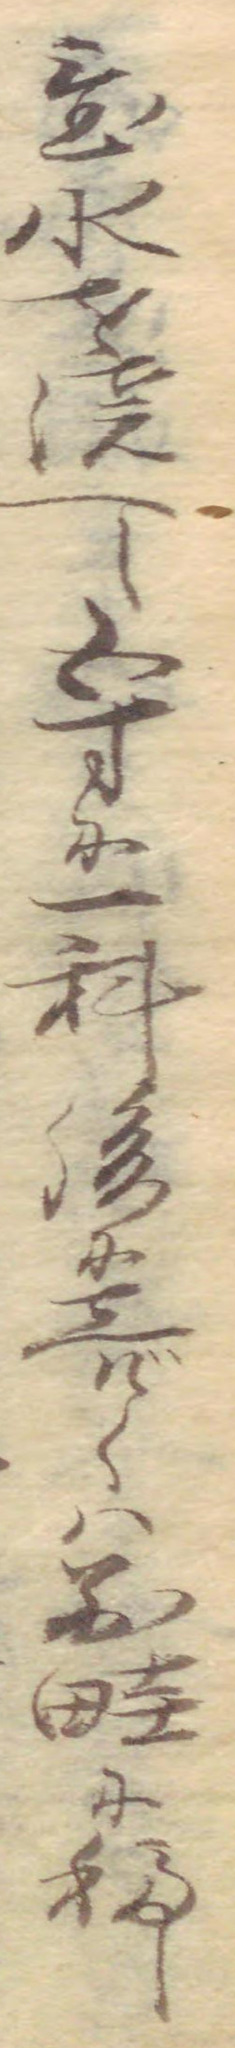置水を澆へし五寸に一科後にしげくハ別畦に移し
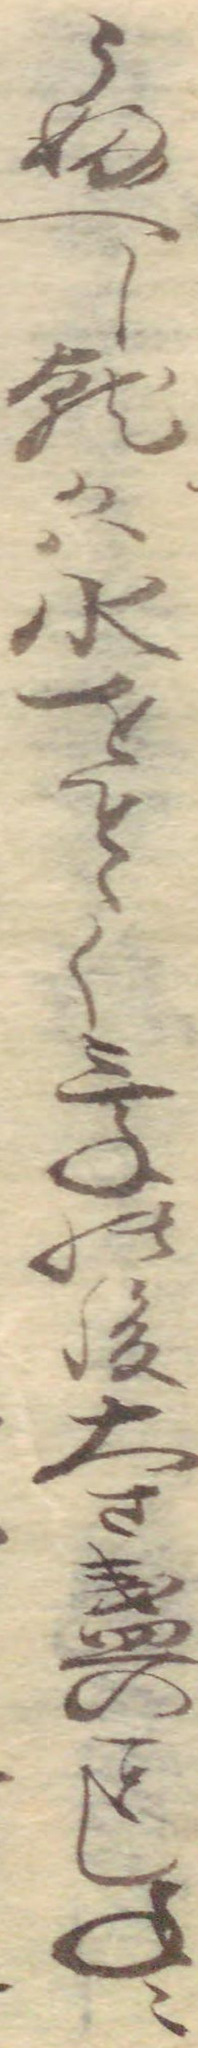うふへし乾かハ水をそゝく三年の後大さ盞のことし年々
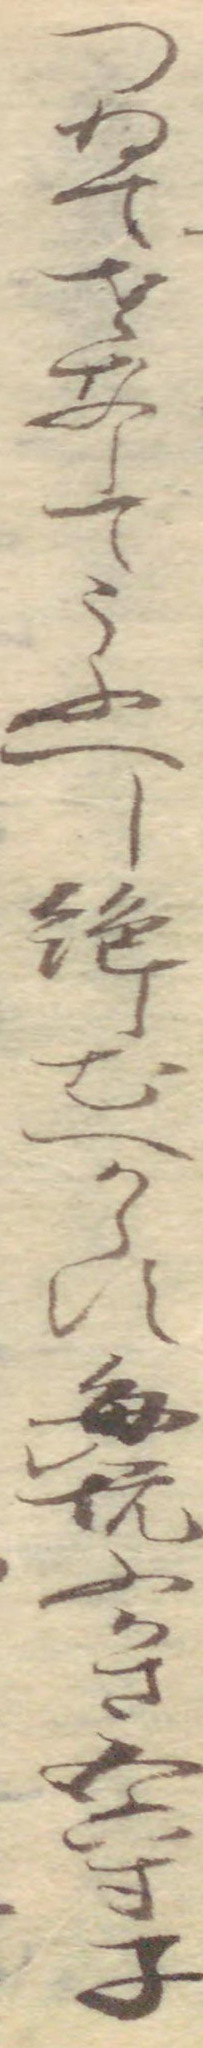つゐてをなしてうふへし絶しむへからす毎坑ふかさ五六寸子
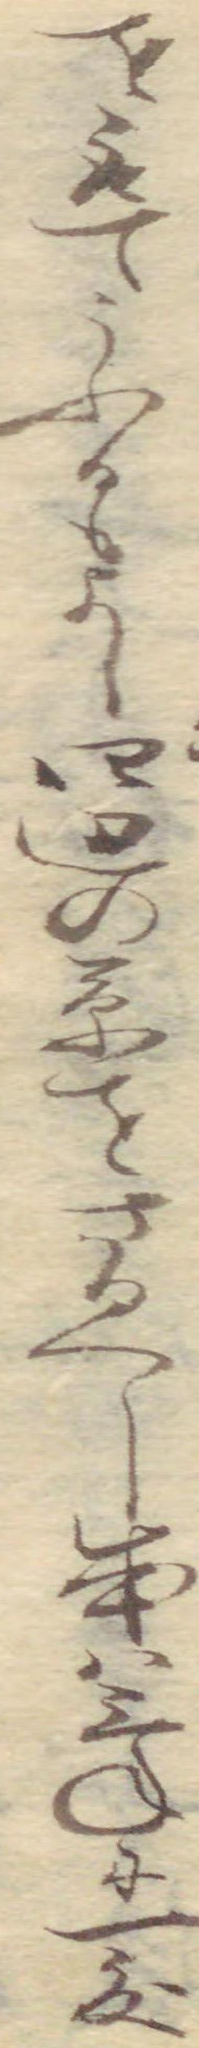を取てうふるもよし四辺の草をさるへし或ハ三年に一度
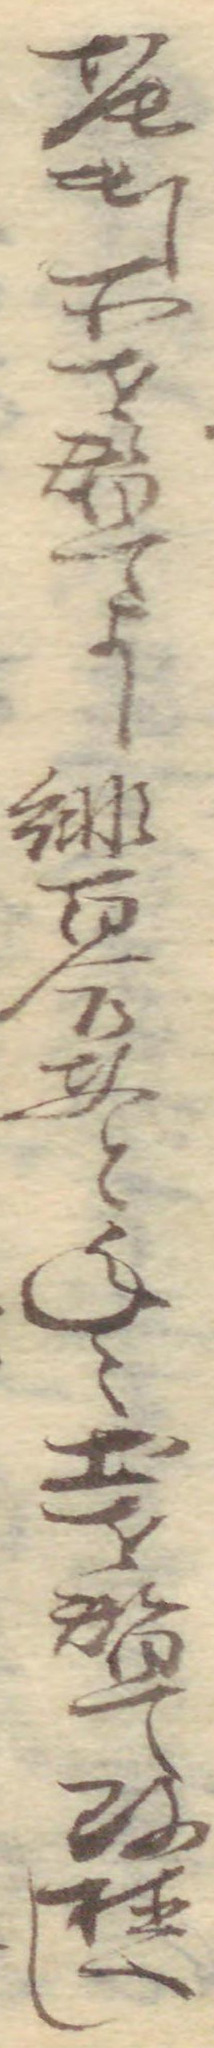堀出し所を替てよし緋百合なと年々土を替て改植へし
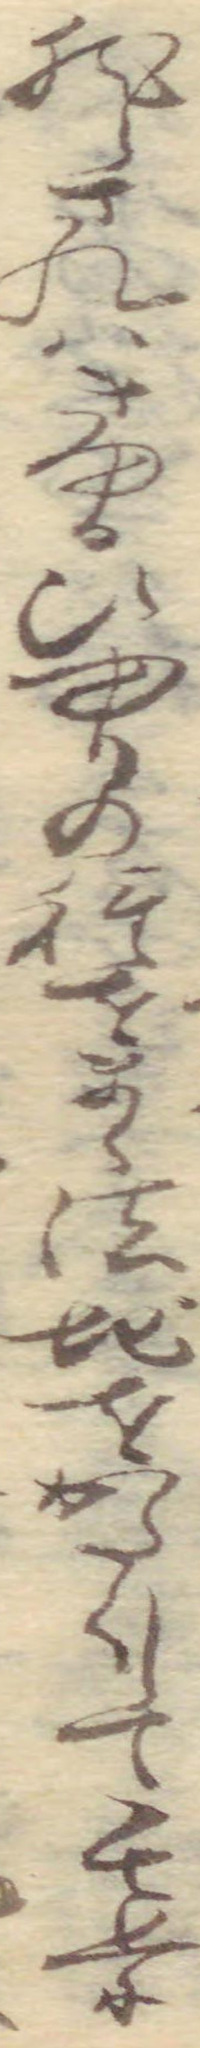然らされハきゆるひゆりの種をまく法地をかたくして其上に
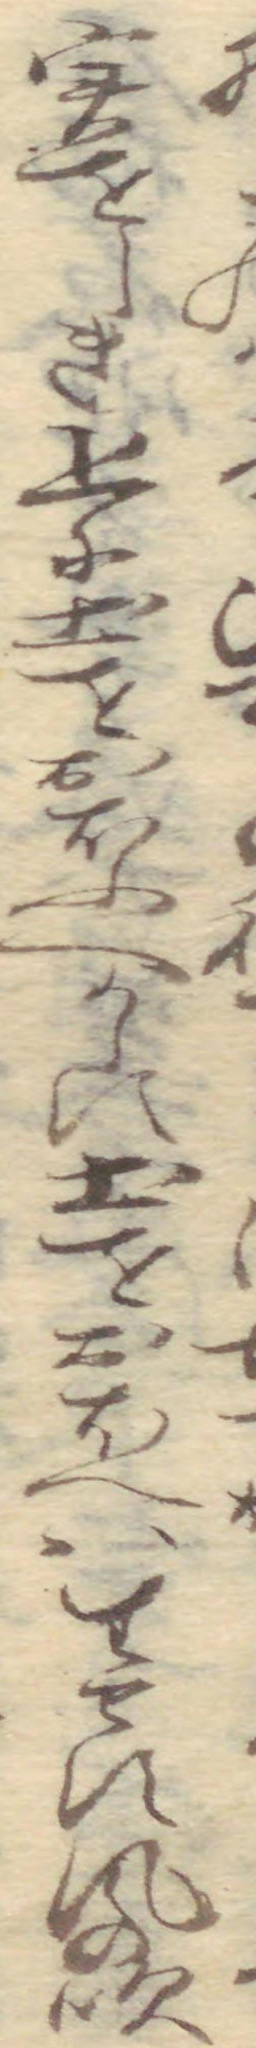実をしき上に土をおほふへからす土をおほへハ生せす風の吹
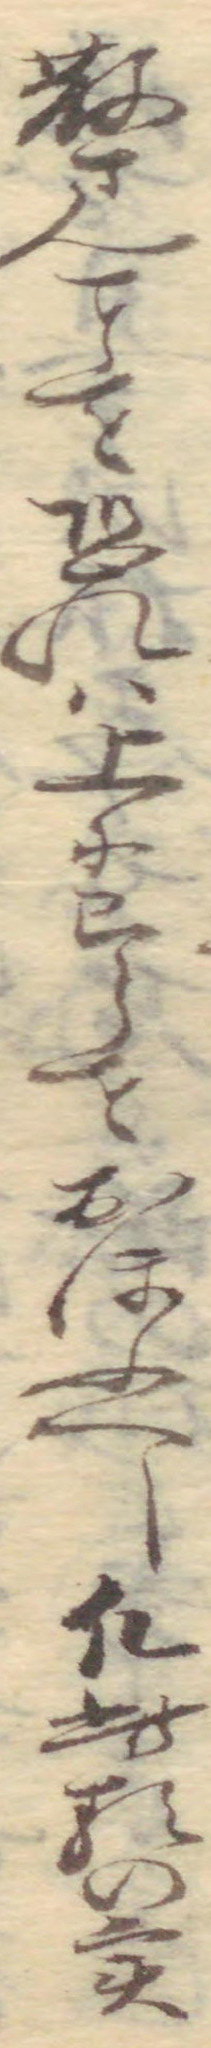散さんことを恐れハ上にわらをおほふへし凡此類の実
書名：鶯宿雑記. 巻199-200
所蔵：国立国会図書館 National Diet Library, JAPAN
